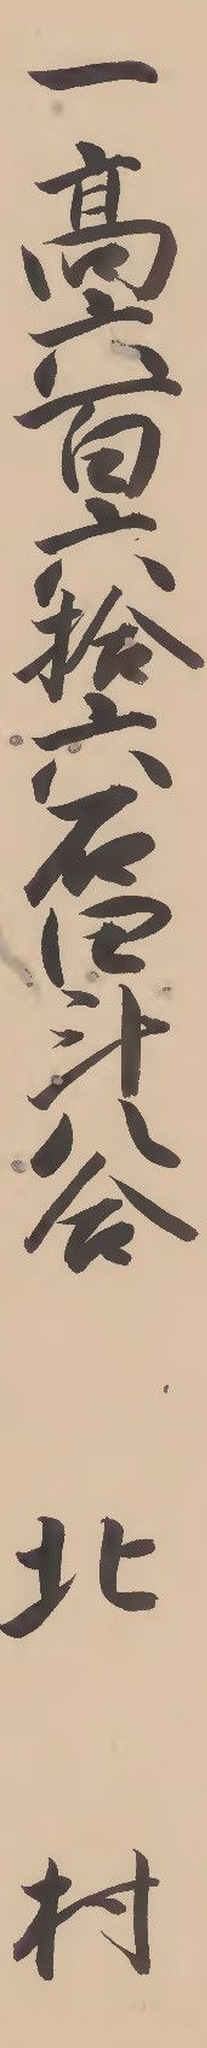一高六百六拾六石四斗八合北村

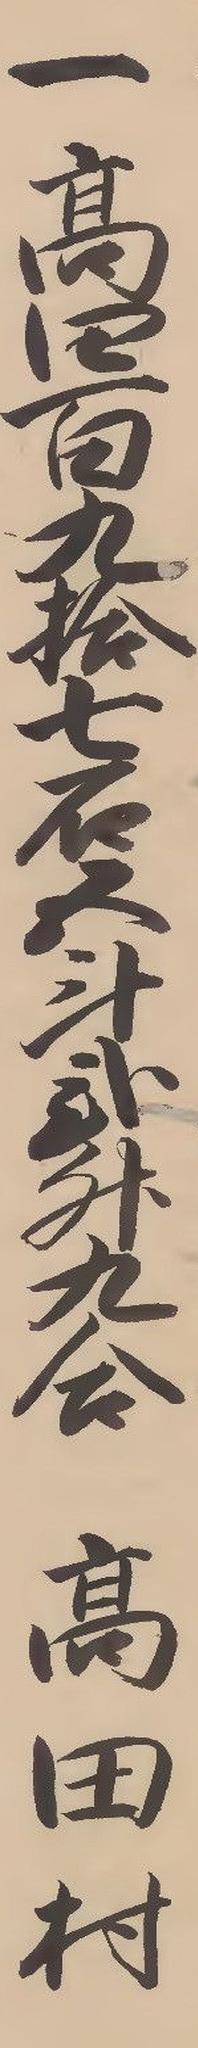一高四百九拾七石五斗弐升九合高田村
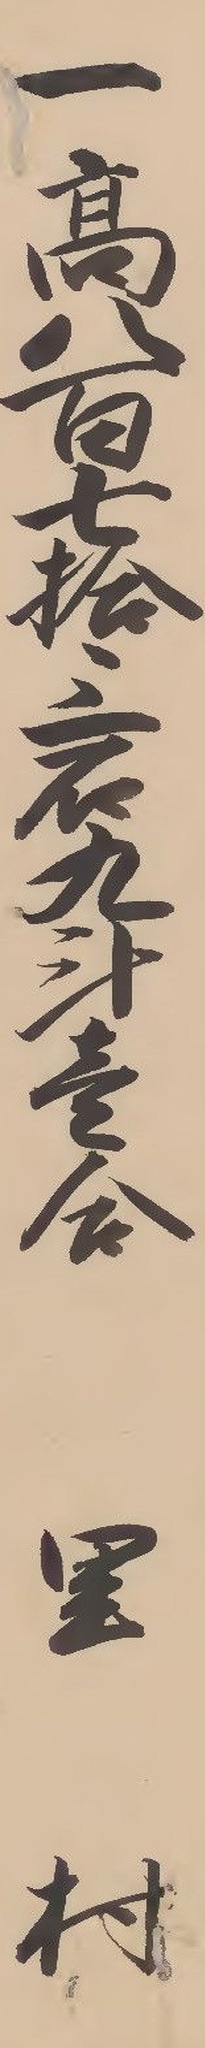一高八百七拾三石九斗壱合里村
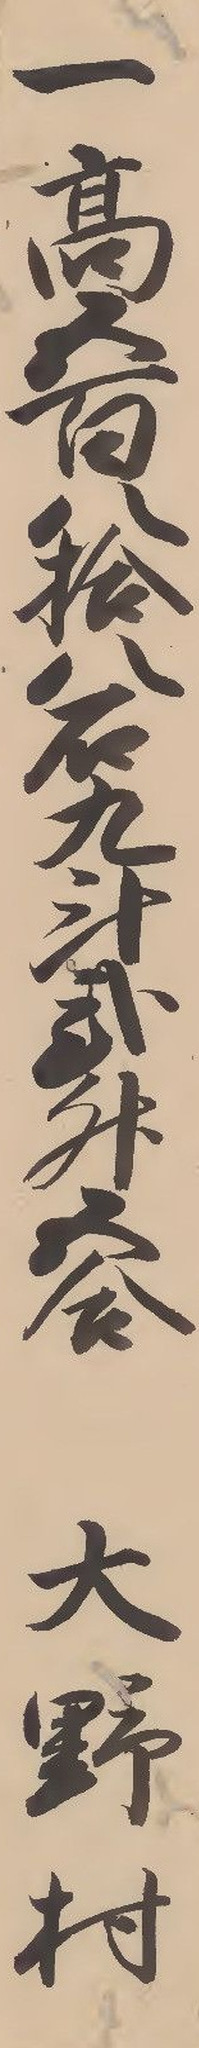一高五百八拾八石九斗弐升五合大野村
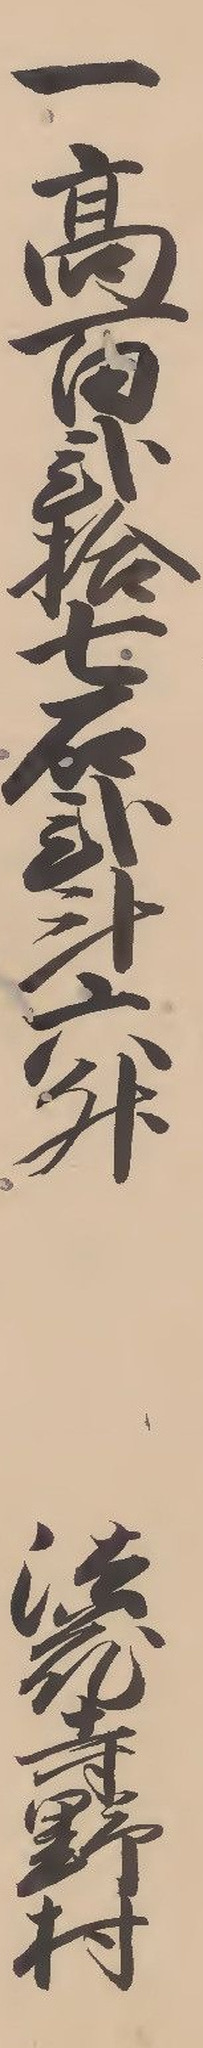一高百弐拾七石弐斗六升法花寺野村
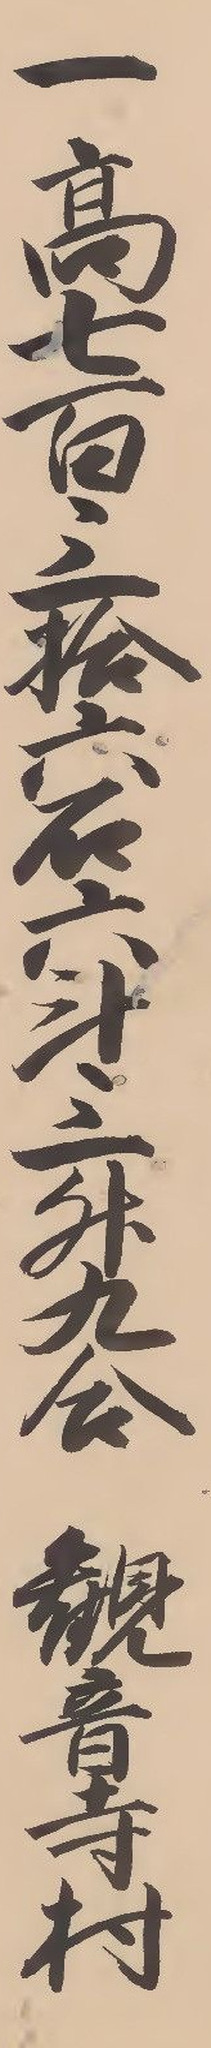一高七百三拾六石六斗三升九合観音寺村
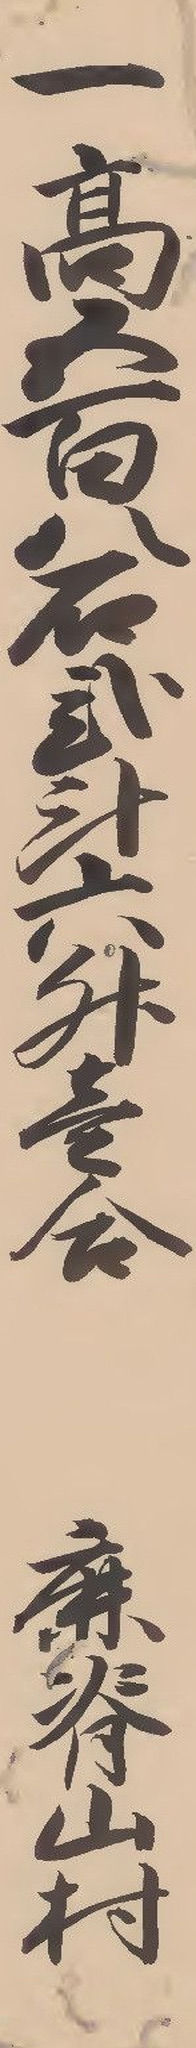一高五百八石弐斗六升壱合鹿背山村
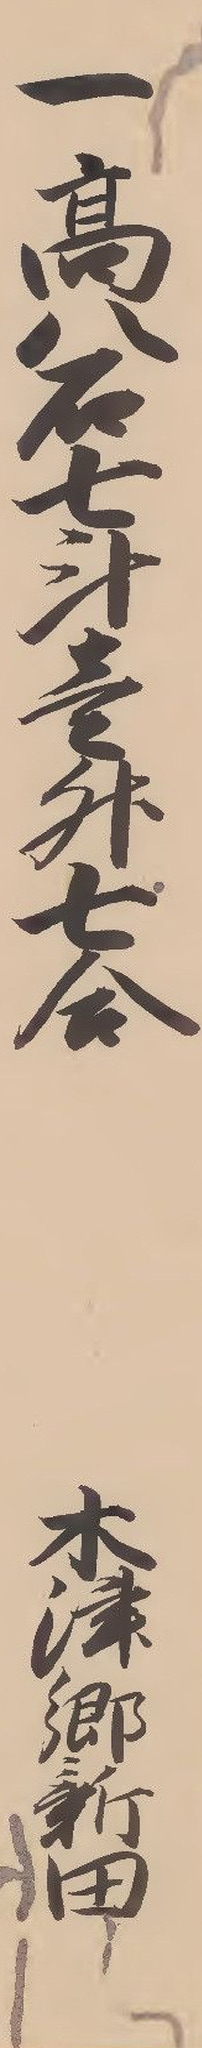一高八石七斗壱升七合木津郷新田
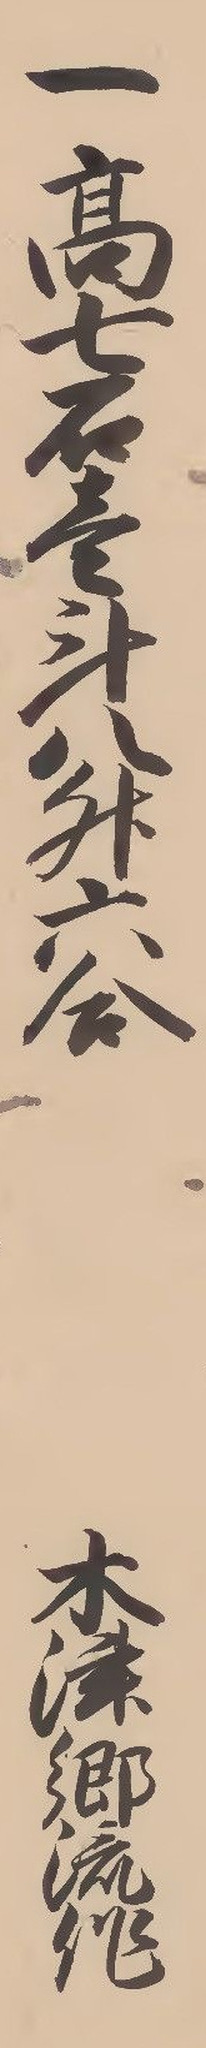一高七石壱斗八升六合木津郷流作

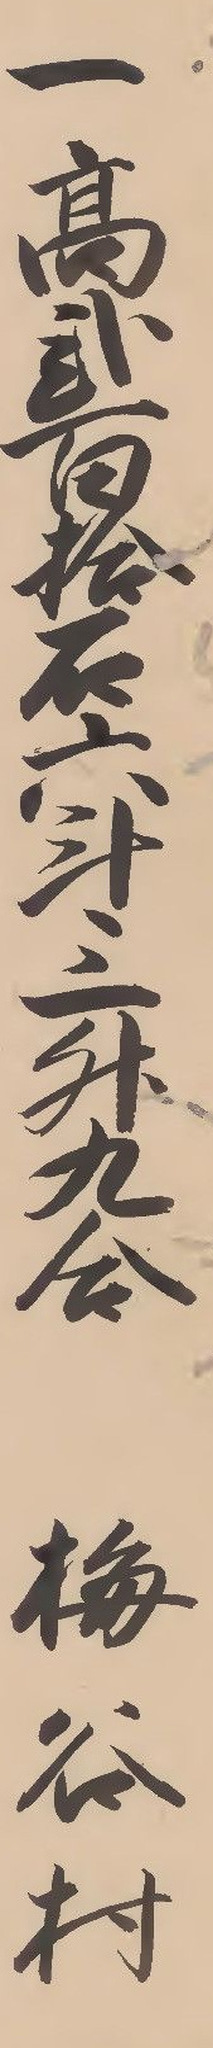一高弐百拾石六斗三升九合梅谷村
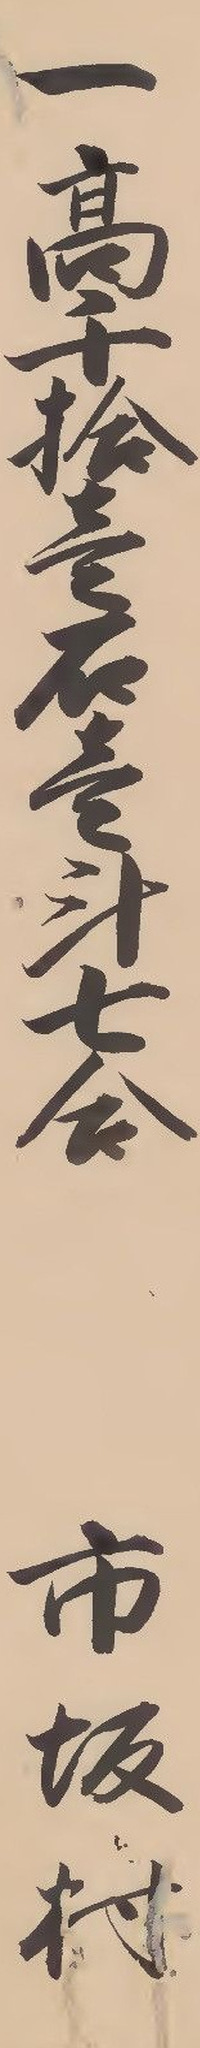一高千拾壱石壱斗七合市坂村
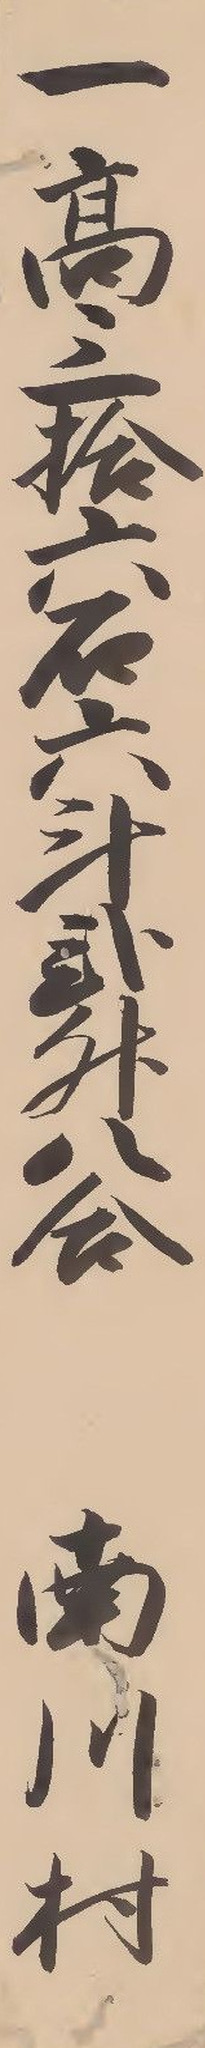一高三拾六石六斗弐升八合南川村
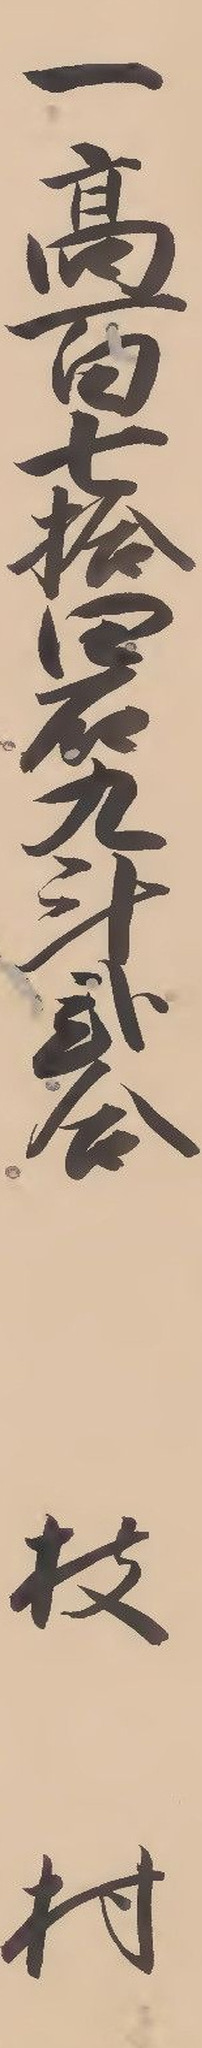一高百七拾四石九斗弐合枝村
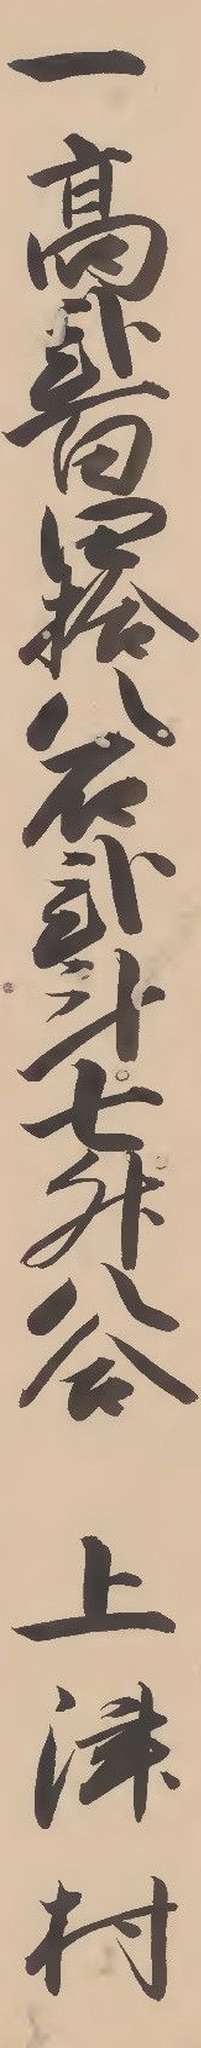一高弐百四拾八石弐斗七升八合上津村
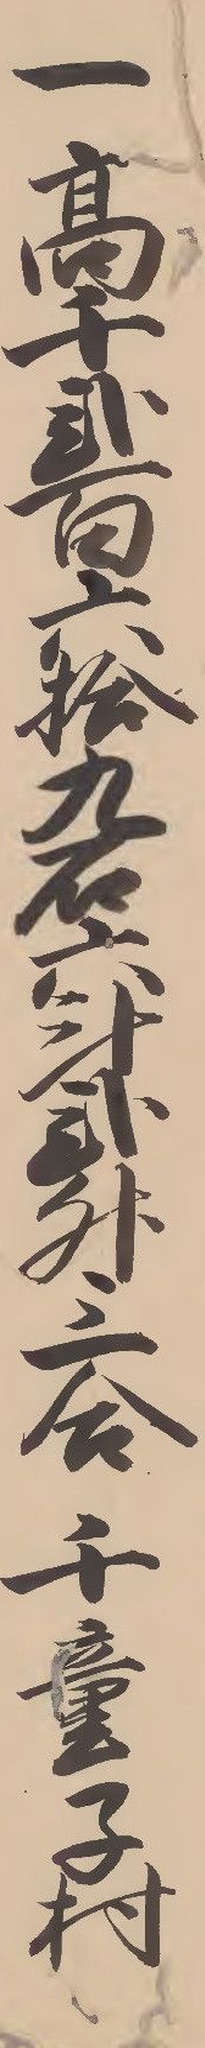一高千弐百六拾九石六斗弐升三合千童子村
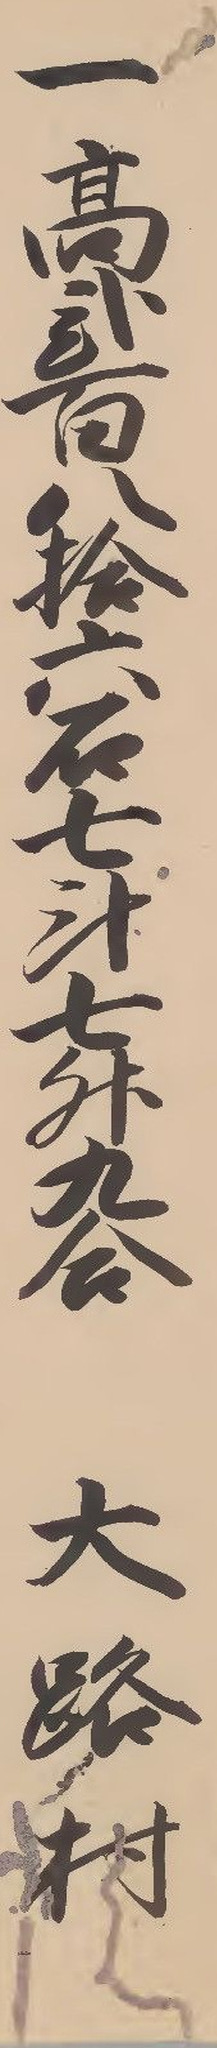一高弐百八拾六石七斗七升九合大路村
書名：山城国郷帳
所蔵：国立公文書館 National Archives of Japan
